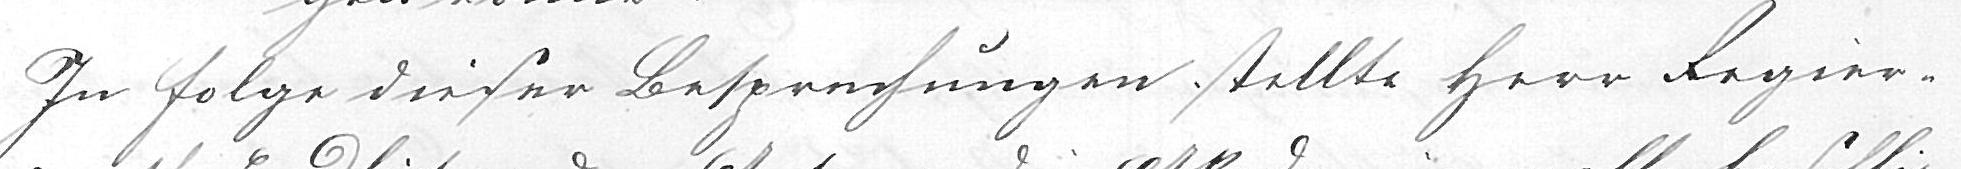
In Folge dieser Besprechungen stellte Herr Regier-
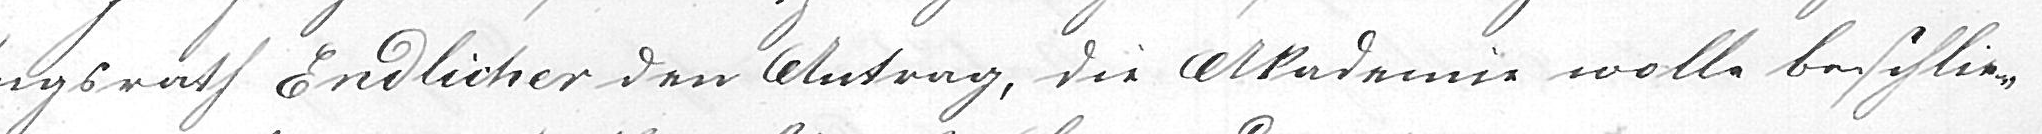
undgsrath Endlicher den Antrag, die Akademie wolle eschlie-
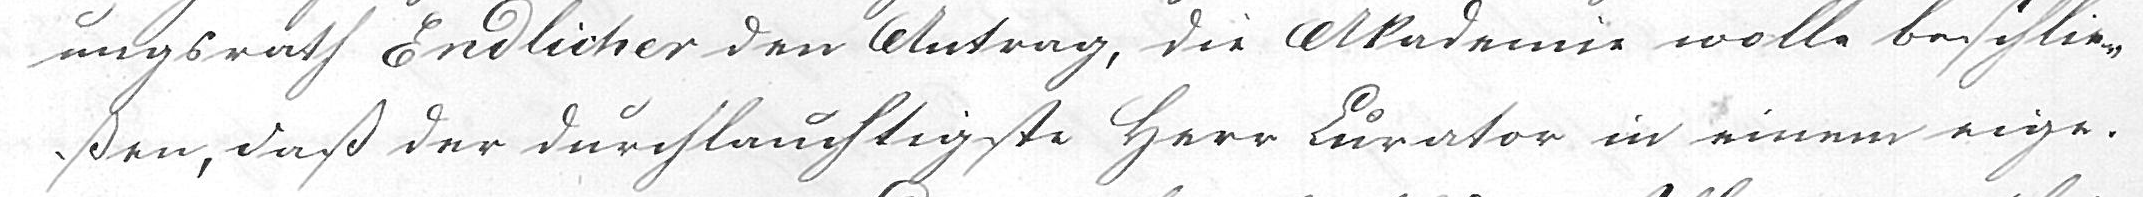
ßen, daß der durchlauchtigste Herr Curator in einem eige-
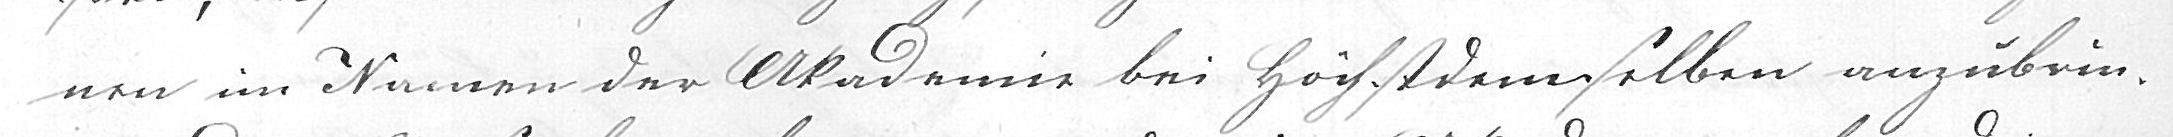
nen im Namen der Akademie bei Höchstdemselben anzubrin-
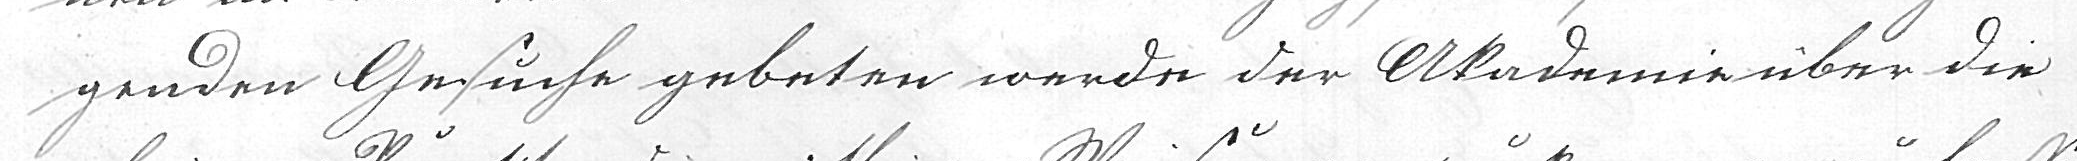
genden Gesuche gebeten werde der Akademie über die
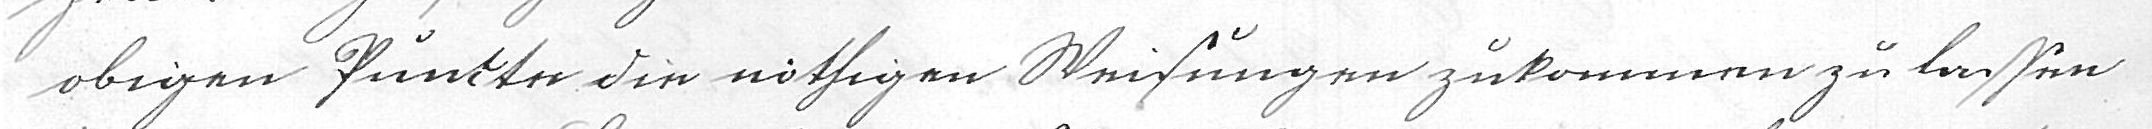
obigen Puncte die nöthigen Weisungen zukommen zu lassen.
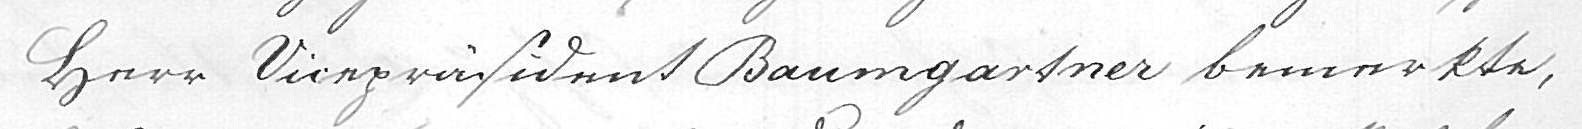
Herr Vicepräsident Baumgartner bemerkte,
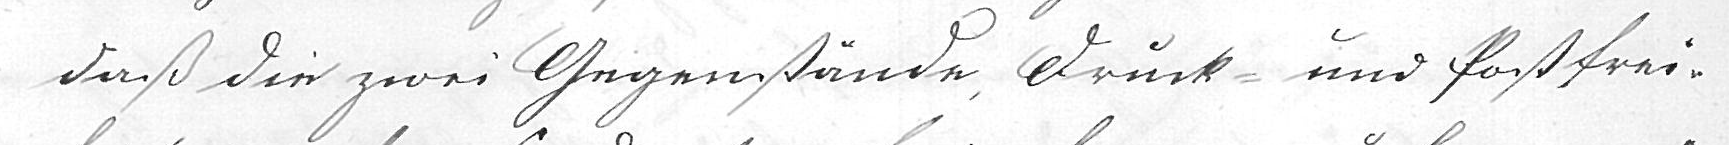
daß die zwei Gegenstaände, Druck- und Postfrei-
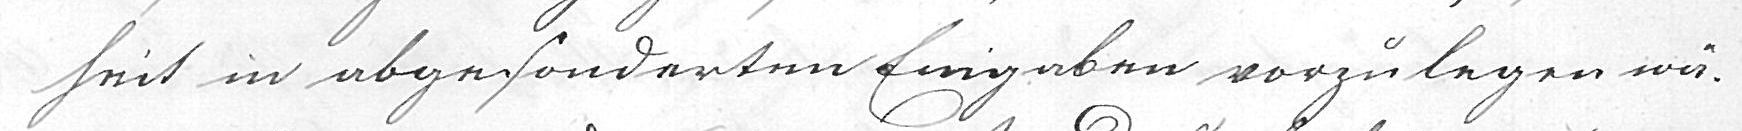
heit in abgesonderten Eingaben vorzulegen wä-
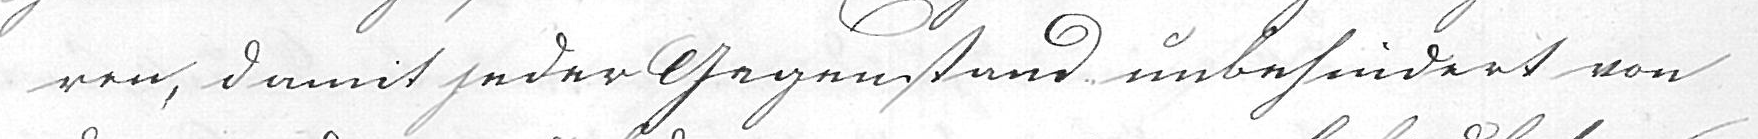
ren, damit jeder Gegenstand unbehindert von
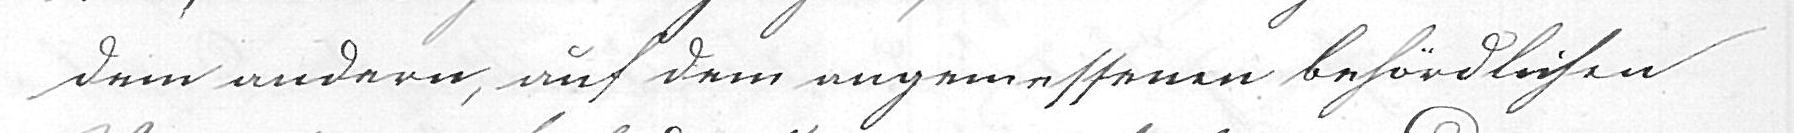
dem andern, auf dem angemessenen behördlichen
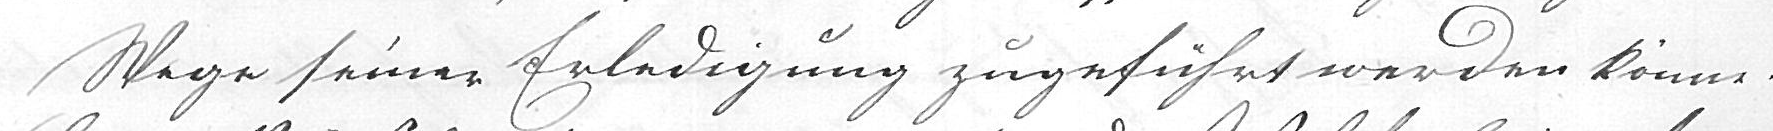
Wege seiner Erledigung zugeführt werden könne.
